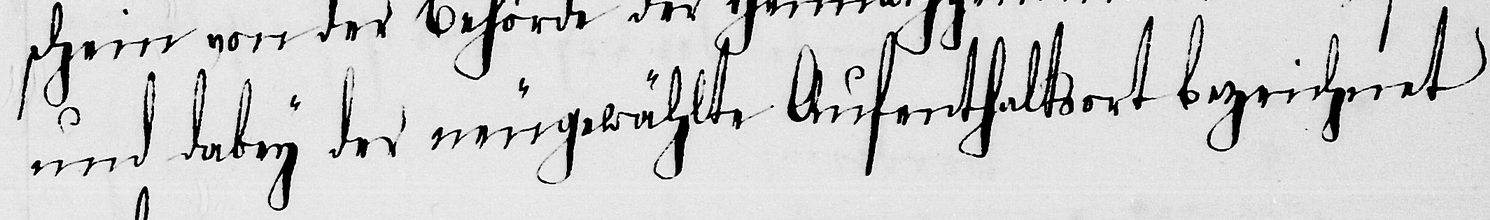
und dabey der neugewählte Aufenthaltsort bezeichnet
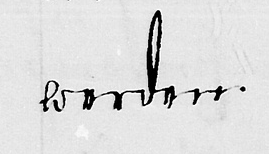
werden.
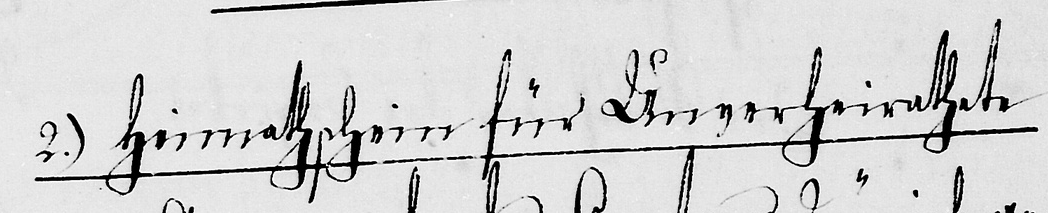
2. Heimathschein für Unverheirathete
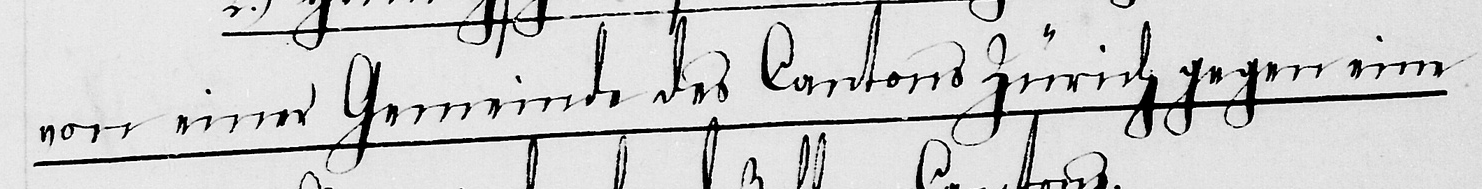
von einer Gemeinde des Cantons Zürich gegen eine
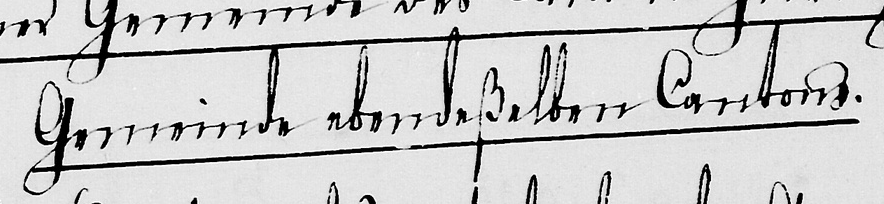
Gemeinde ebendeßelben Cantons.
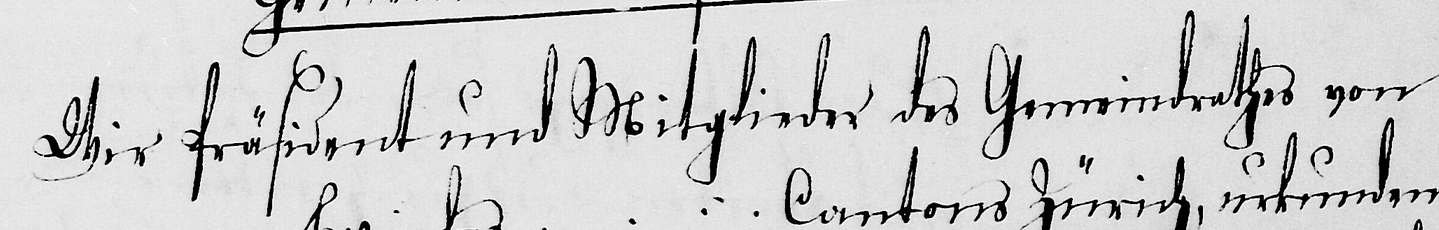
Wir Präsidenten und Mitglieder des Gemeindrathes von
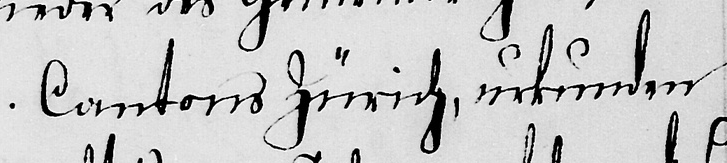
Cantons Zürich, urkunden
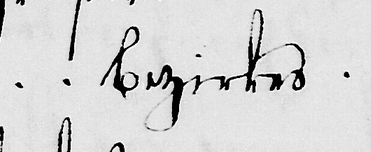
Bezirks
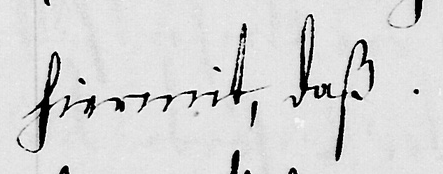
hiermit, daß
